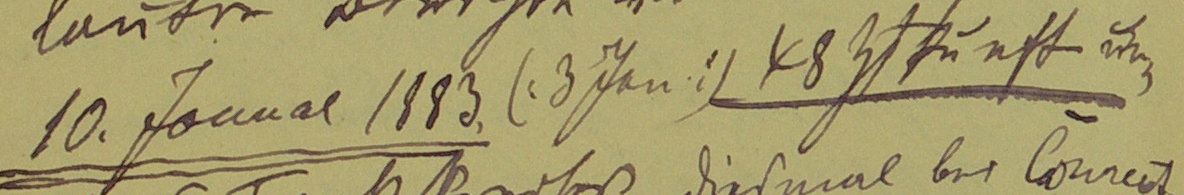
10. Januar 1883 ( ?....) 48. Zusammenkunft un¬
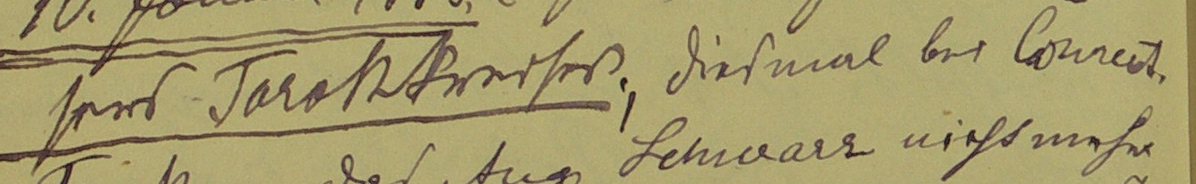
seres Tarokkreises, diesmal bei ? …
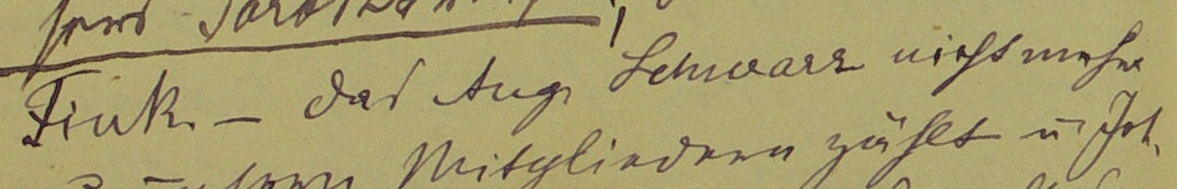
Fink ,-das Aug. Schwarz nicht mehr
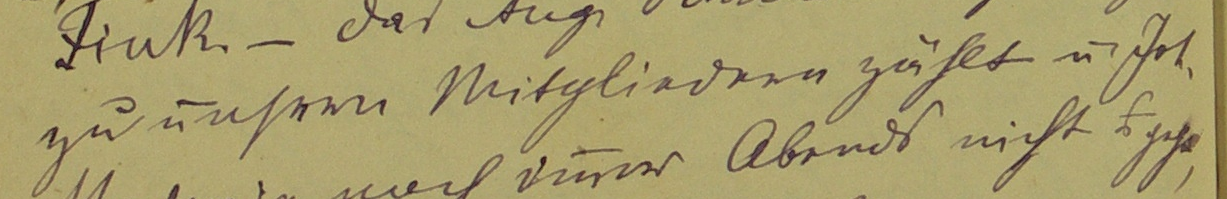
zu unseren Mitgliedern zählt und Joh.
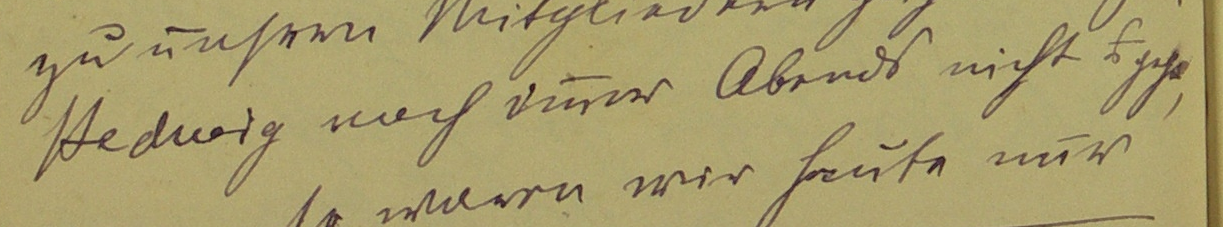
Hedwig noch immer abends nicht ausgeht,
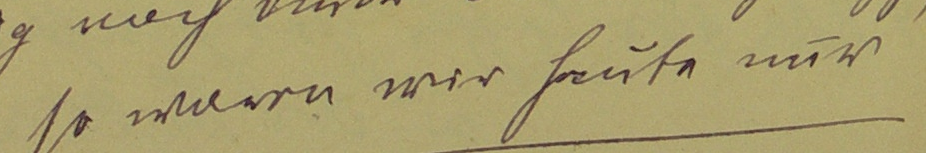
so waren wir heute nur
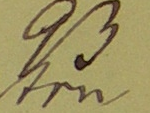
91
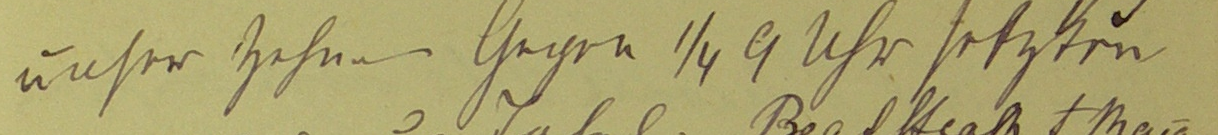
unser zehn.- gegen ¼ 9 Uhr setzten
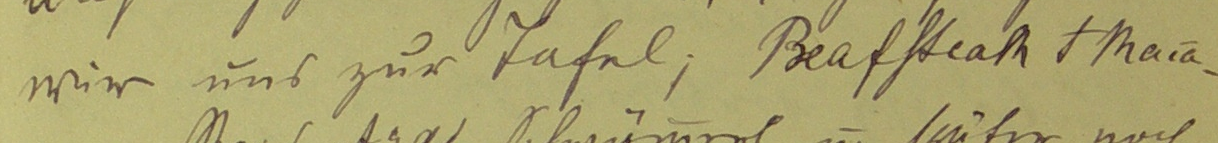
wir uns zur Tafel; Beafsteak mit Ma¬
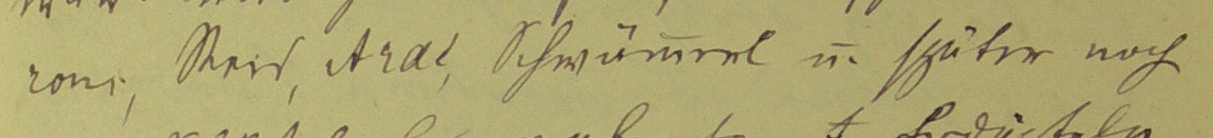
roni, Reis, ? Arai, Schwammerl und später noch
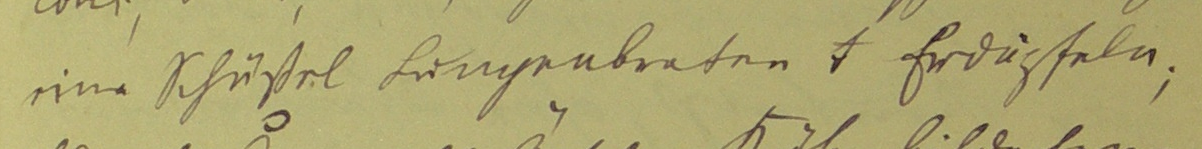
eine Schüssel Lungenbraten mit Erdäpfeln,
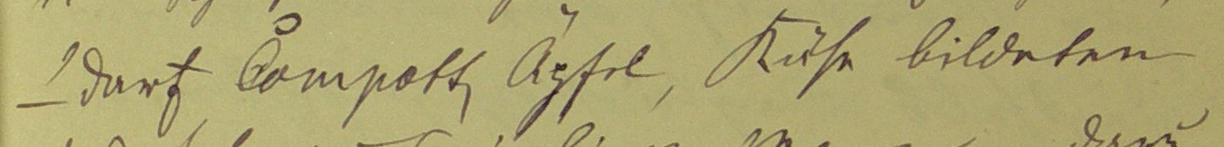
-darauf Compott, Äpfel, Käse bildeten
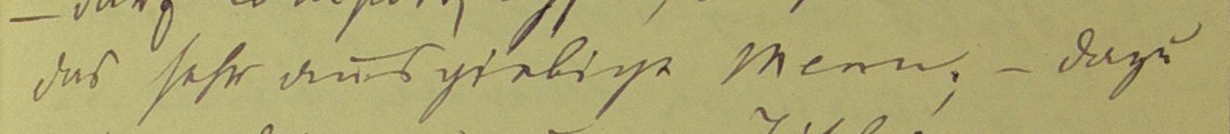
das sehr ausgiebige Menu.-Dazu
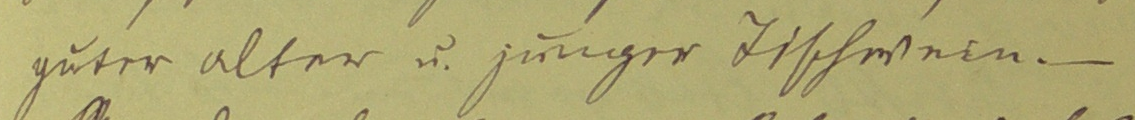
guter alter und junger Tischwein.
